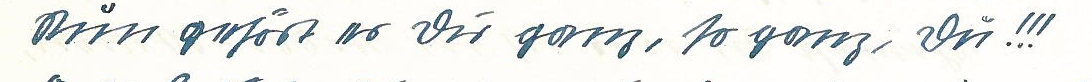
Nun gehört er Dir ganz, so ganz, Du!!!
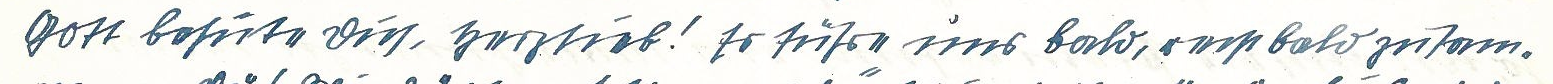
Gott behüte Dich, Herzlieb! Er führe uns bald, recht bald zusam¬
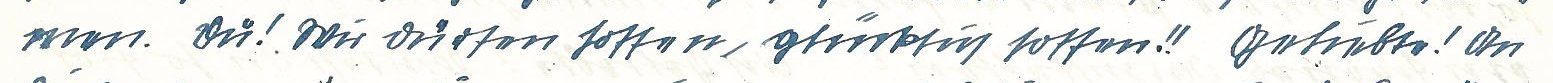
men. Du! Wir dürfen hoffen, glücklich hoffen!! Geliebte! An
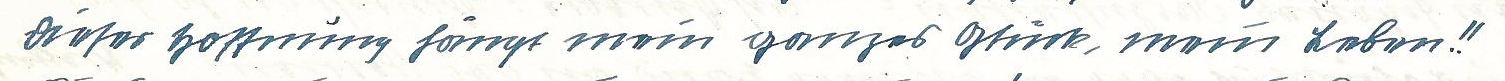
dieser Hoffnung hängt mein ganzes Glück, mein Leben!!
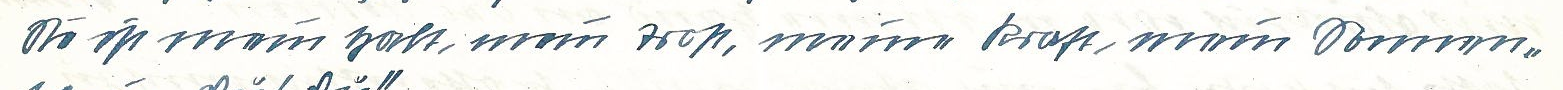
Sie ist mein Halt, mein Trost, meine Kraft, mein Sonnens¬
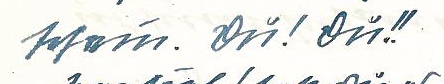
chein. Du! Du!!
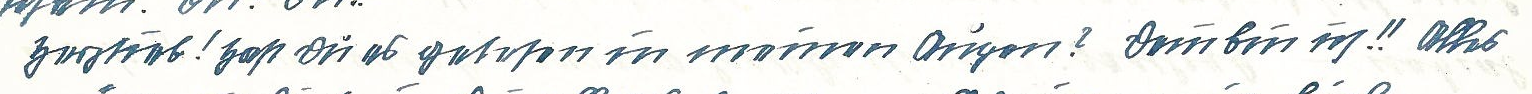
Herzlieb! Hast Du es gesehen in meinen Augen? Dein bin ich!! Alles
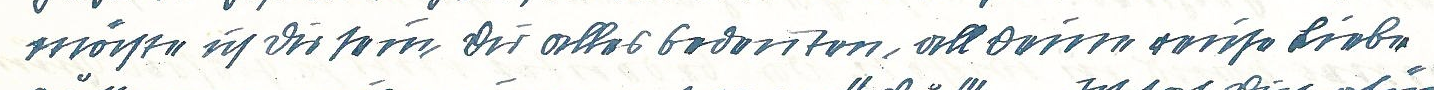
möchte ich Dir sein, Dir alles bedeuten, all Deine reiche Liebe
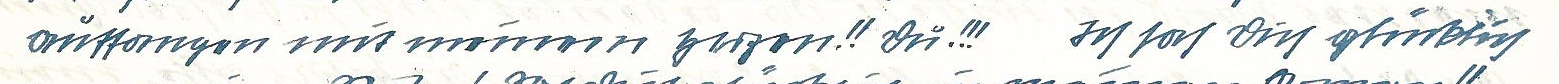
auffangen mit meinem Herzen!! Du!!! Ich sah Dich glücklich
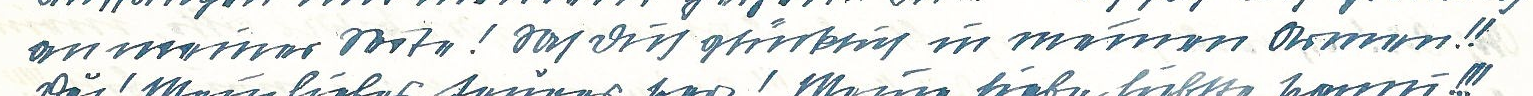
an meiner Seite! Sah Dich glücklich in meinen Armen!!
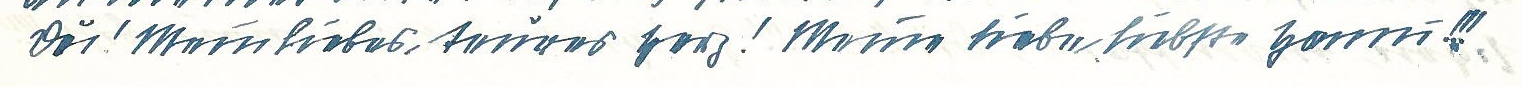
Du! Mein liebes, teures Herz! Meine liebe, liebste !!!
